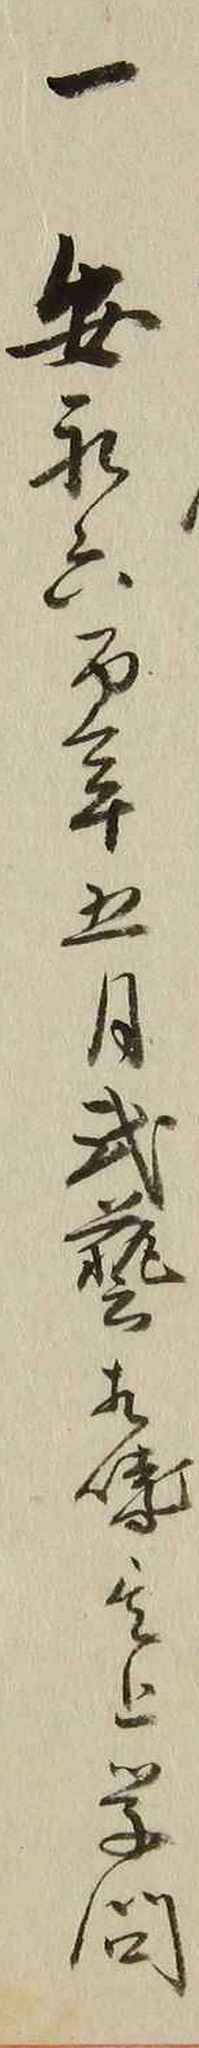一安永六酉年五月武芸相嗜其上学問
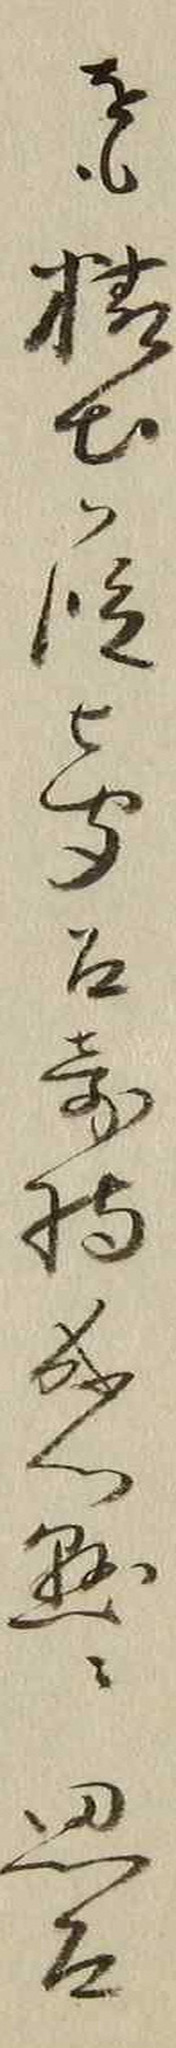をも精出候段被聞召奇特成心懸ニ思召
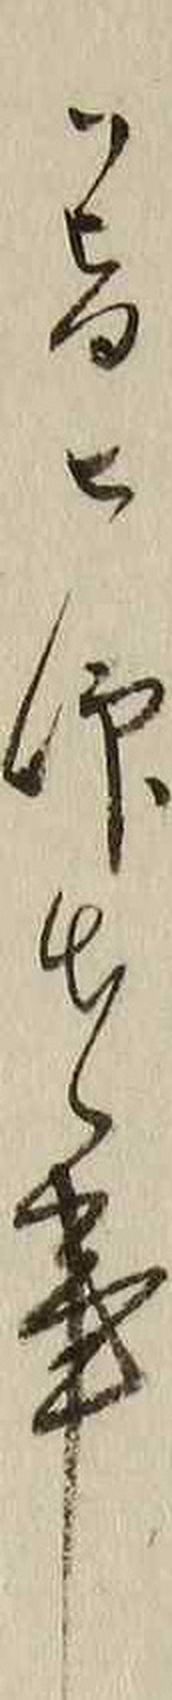候旨被仰出候事
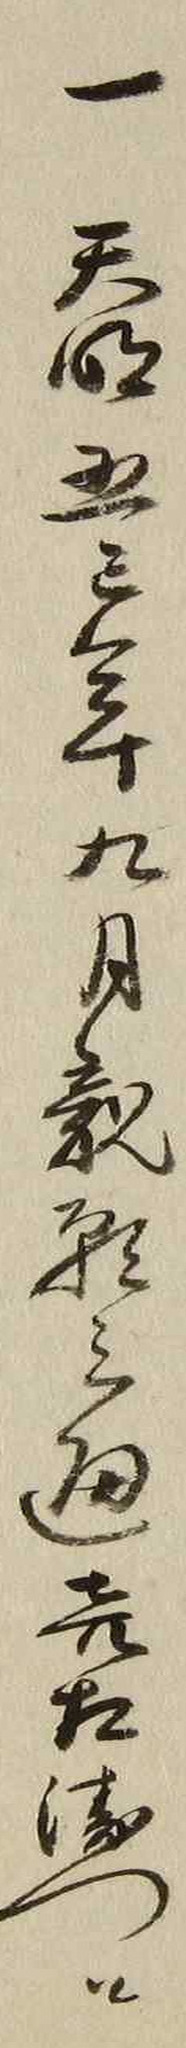一天明五巳年九月親願之通喜左衛門と
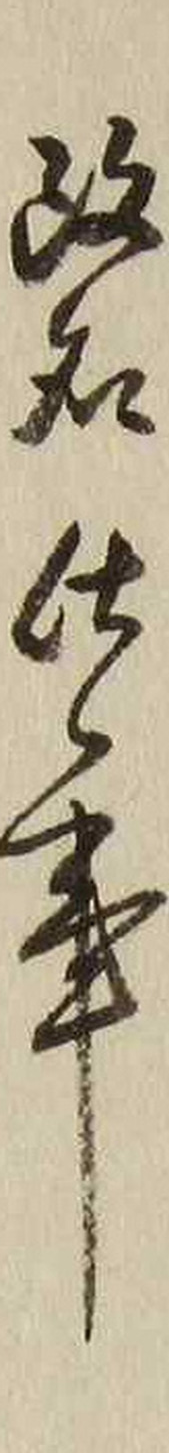改名仕候事
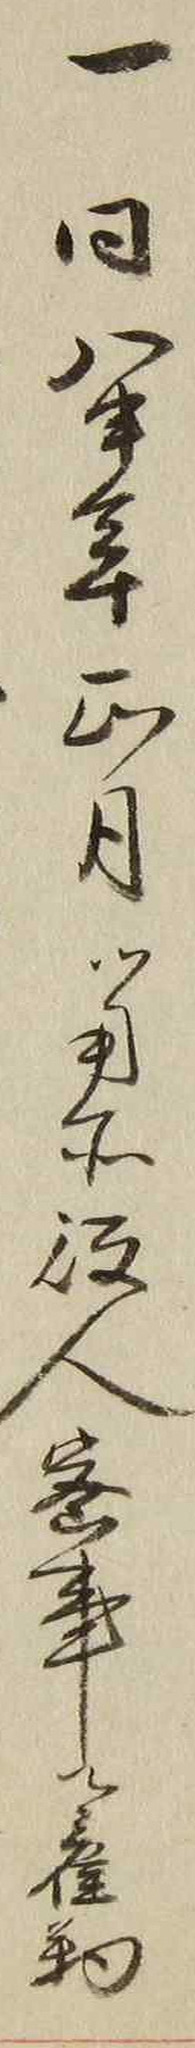一同八申年正月御用所役人密事御雇勤
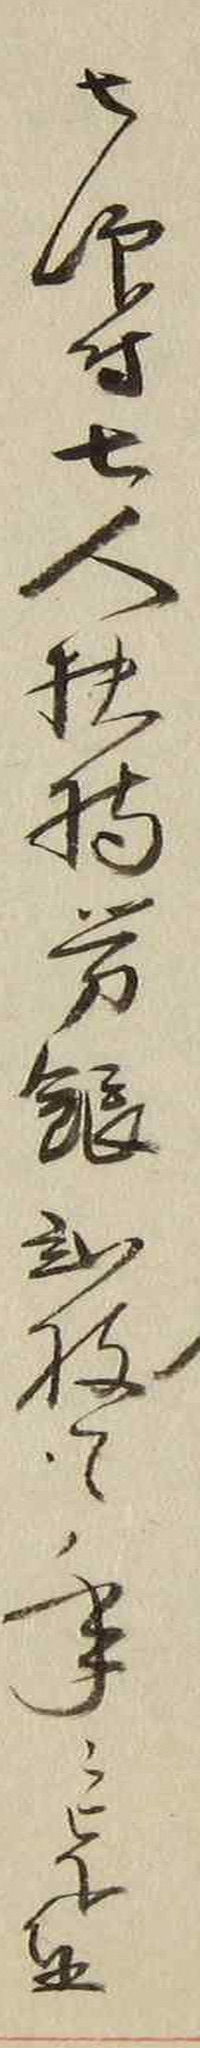被仰付七人扶持労銀弐枚ツヽ年々被下置
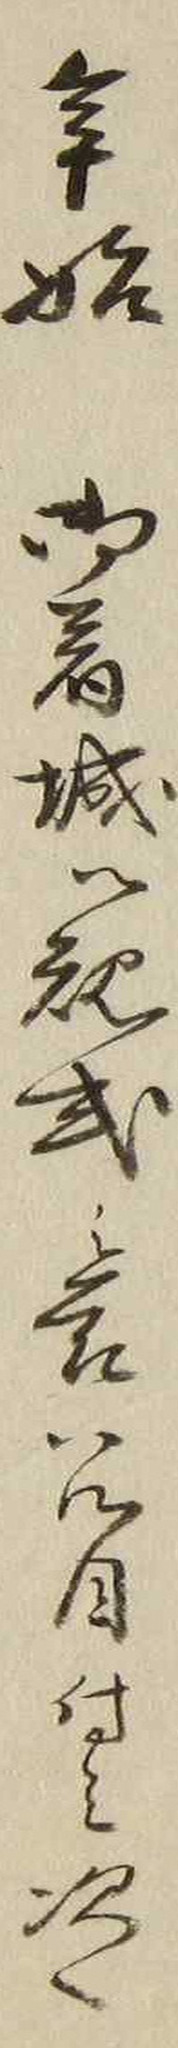年始御着城御規式之節ハ御目付之次へ
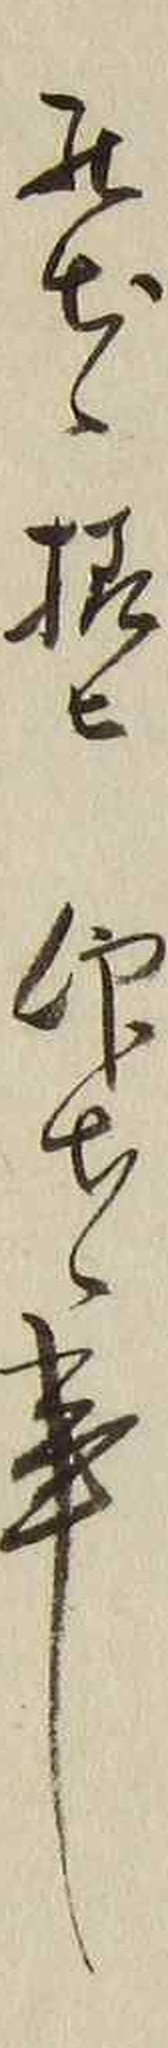罷出候様被仰出候事
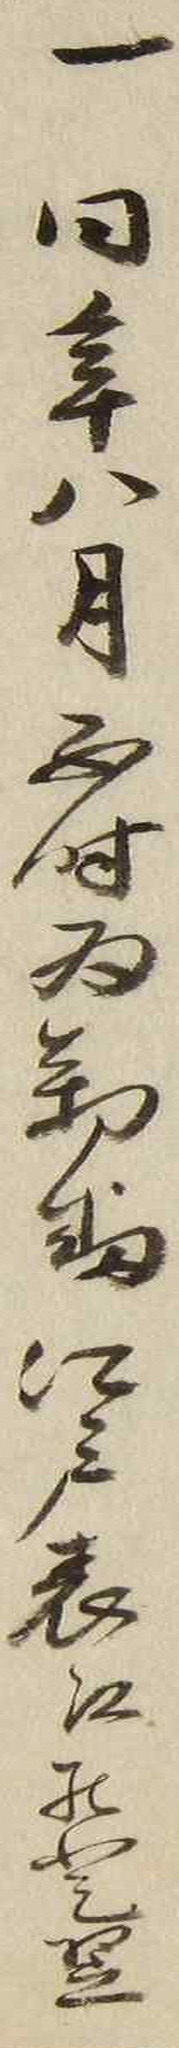一同年八月不時為勤番江戸表江罷登翌
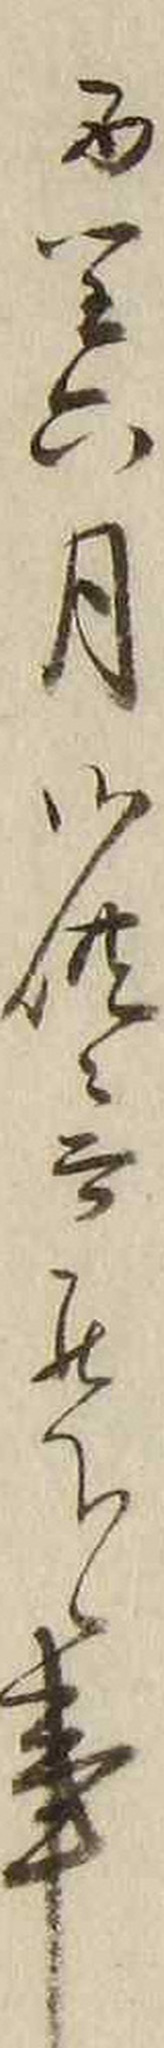閏六月御供ニ而罷下候事

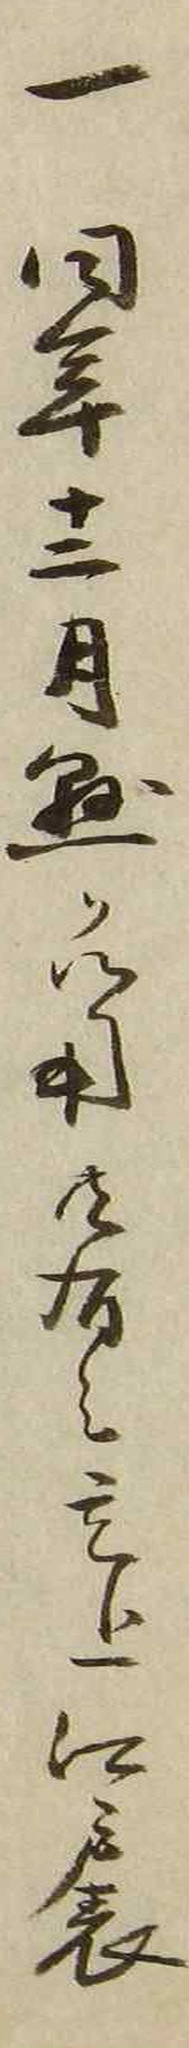一同年十二月懸り御用共有之其上江戸表
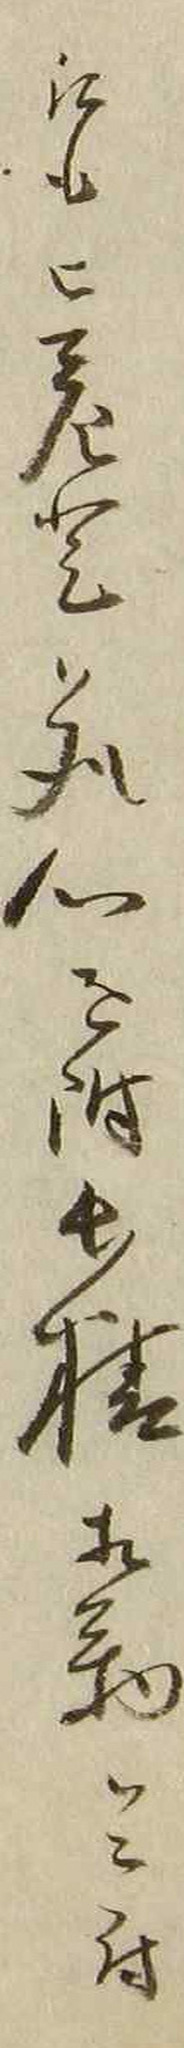江も被差登候処心を附出精相勤候ニ付
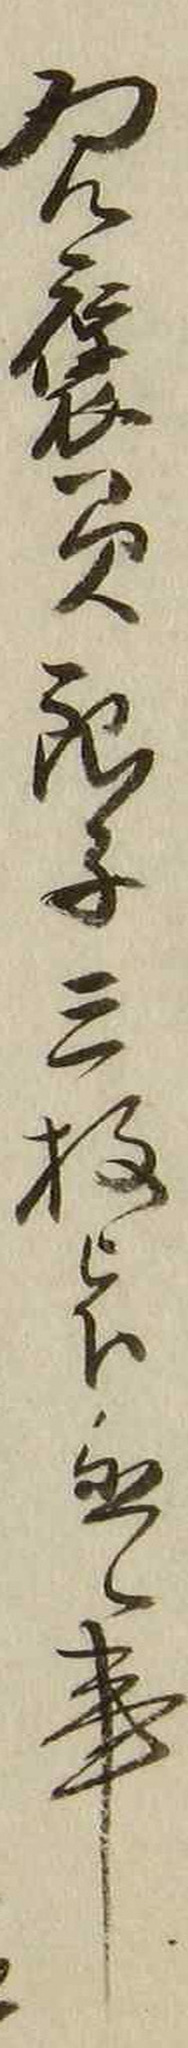為御褒美銀子三枚被下置候事
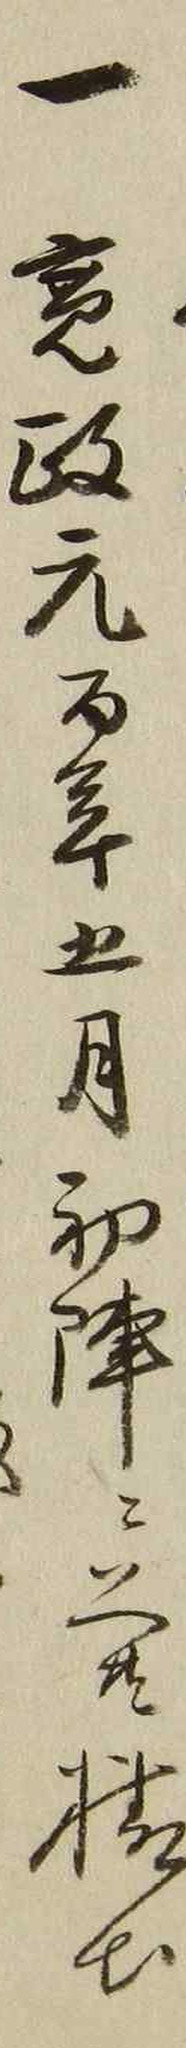一寛政元酉年五月初陣ニ候へ共精出
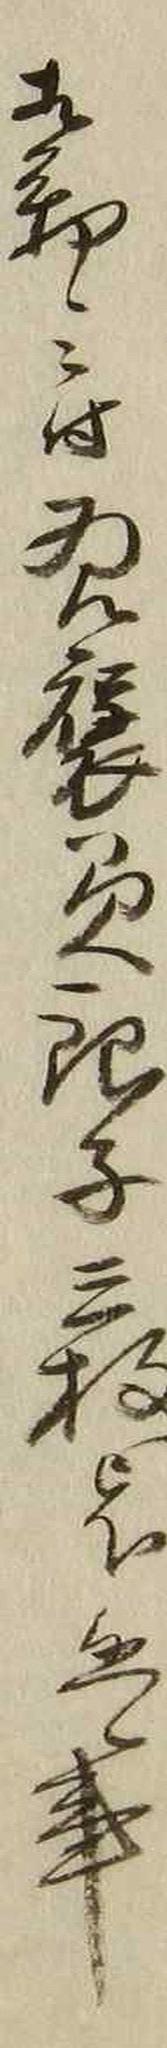相勤候ニ付為御褒美銀子三枚被下置候事
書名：諸士系譜　巻之311　し之部1
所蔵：会津若松市立会津図書館
